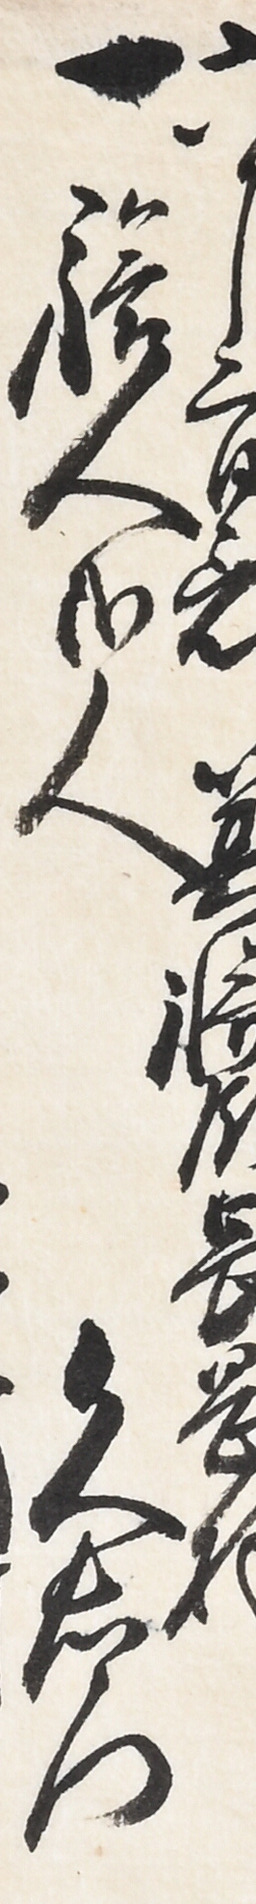一旅人弐人久右衛門
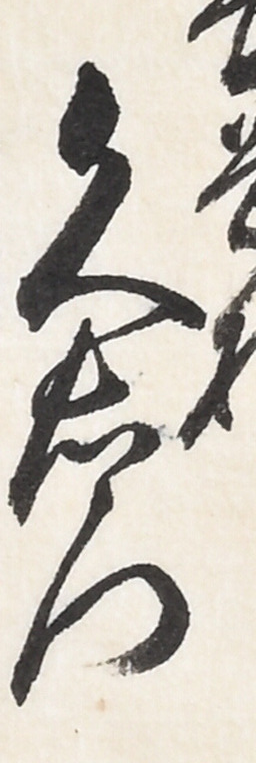宇右衛門
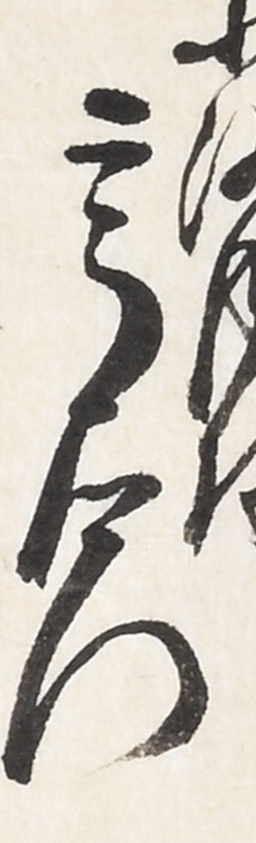宇右衛門
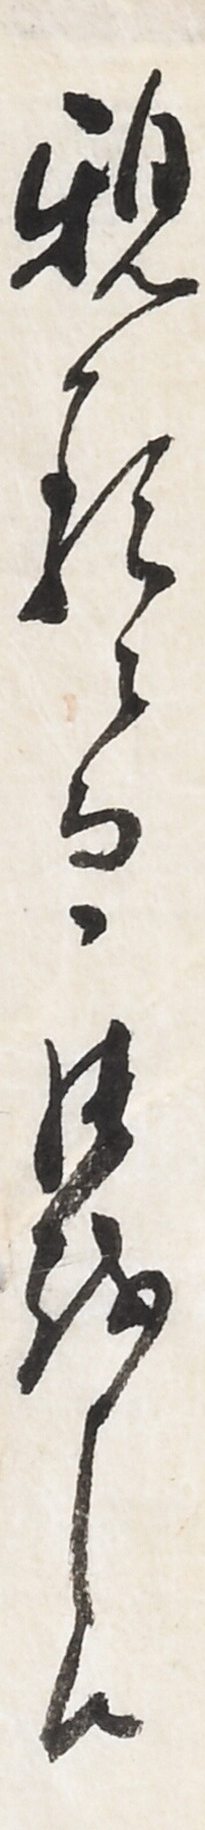親類ニ而罷越申候
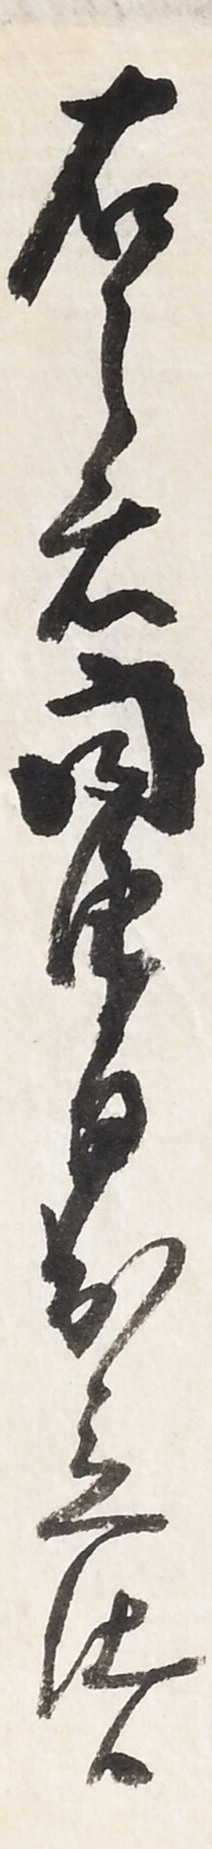右之者同四日出立仕候・
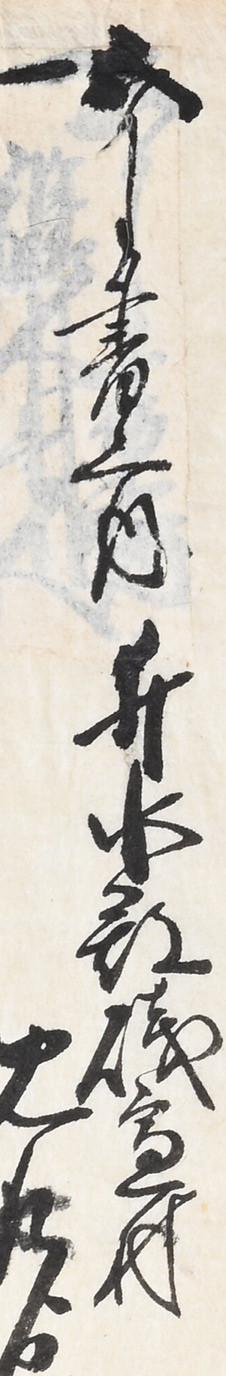五月書上内井水郡磯辺村
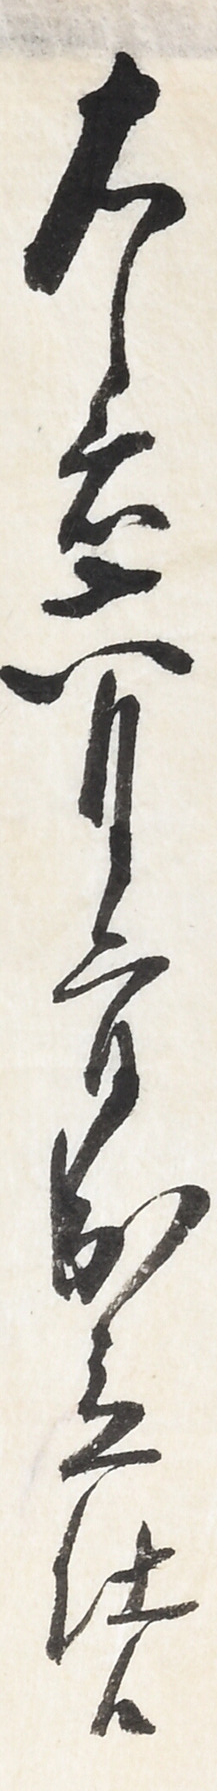右之者六月二日出立仕候
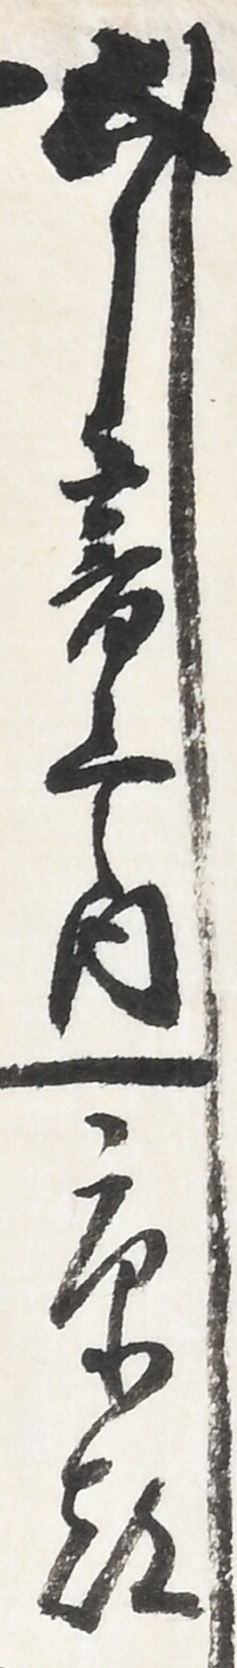五月書上げ之内京都
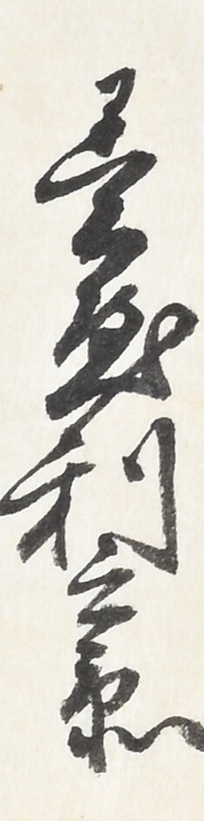墨屋利兵衛
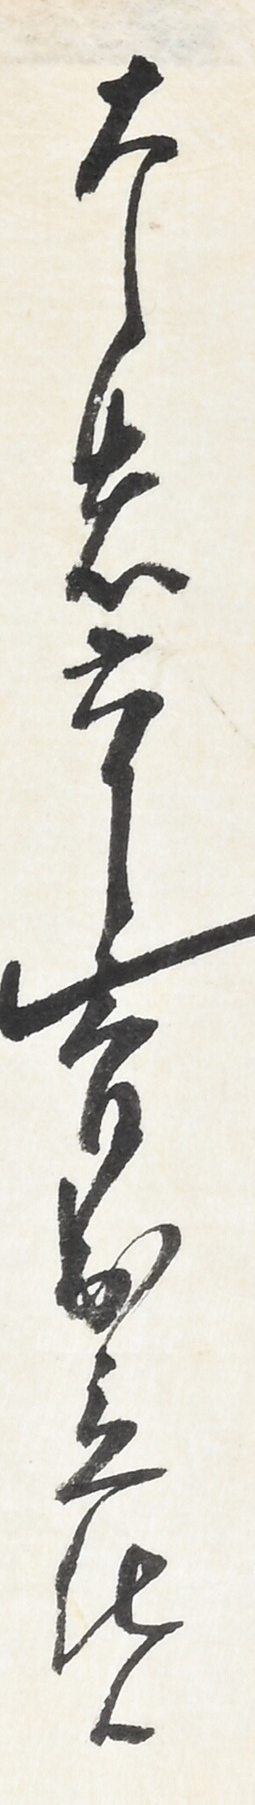右之者六月二日出立仕候
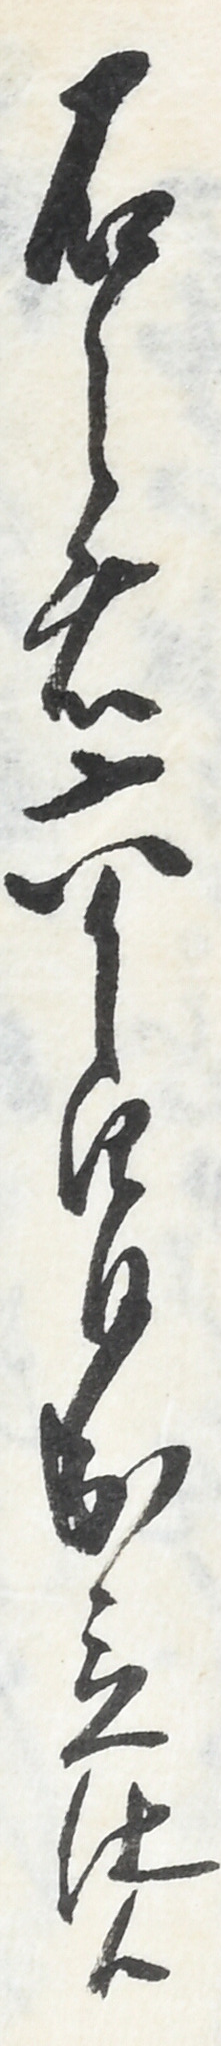右之者六月二日出立仕候

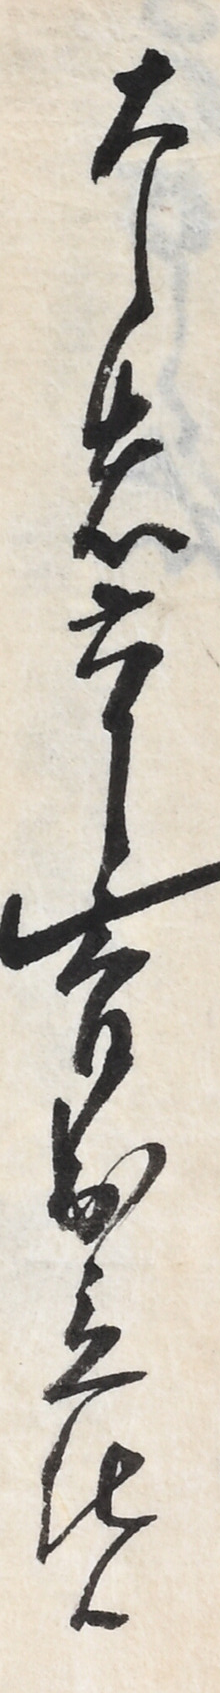右之者六月四日出立仕候
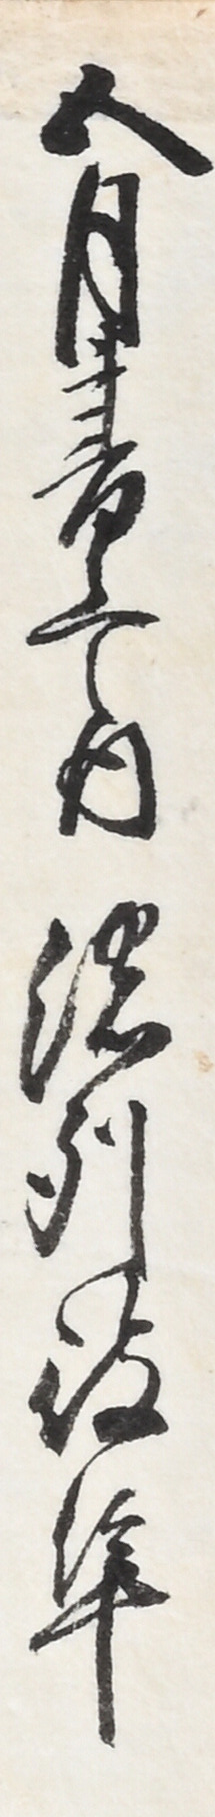五月書上之内濃州役隼
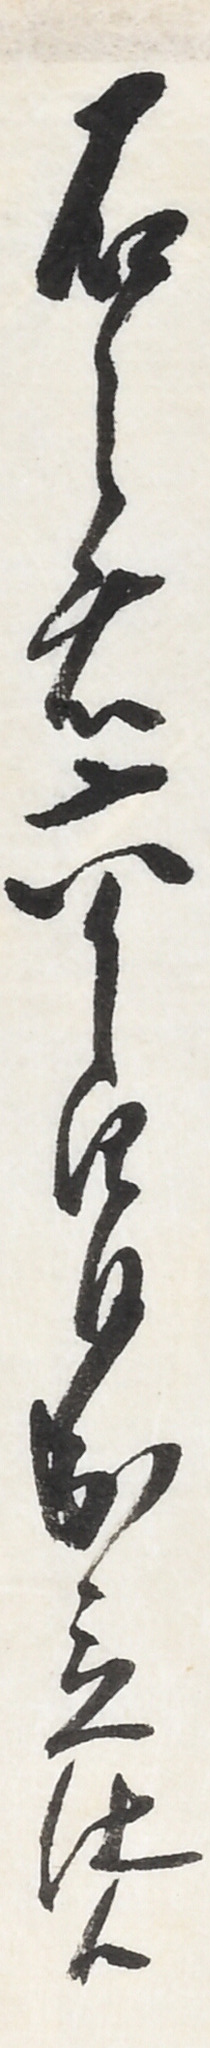右之者六月四日出立仕候
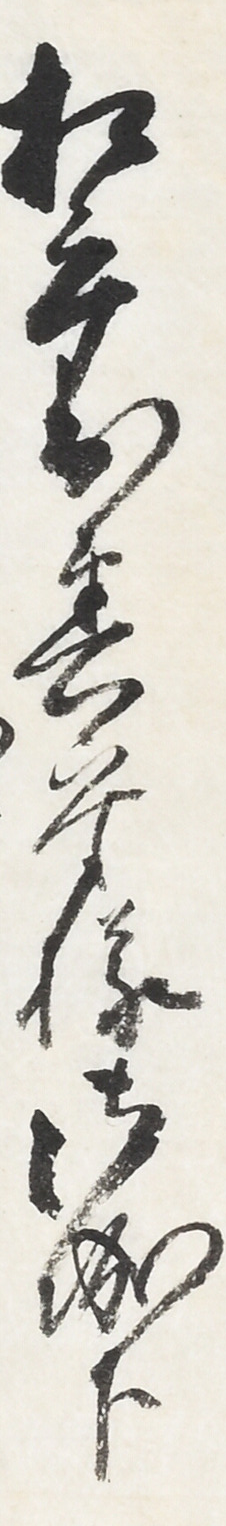松平出雲守様御城下
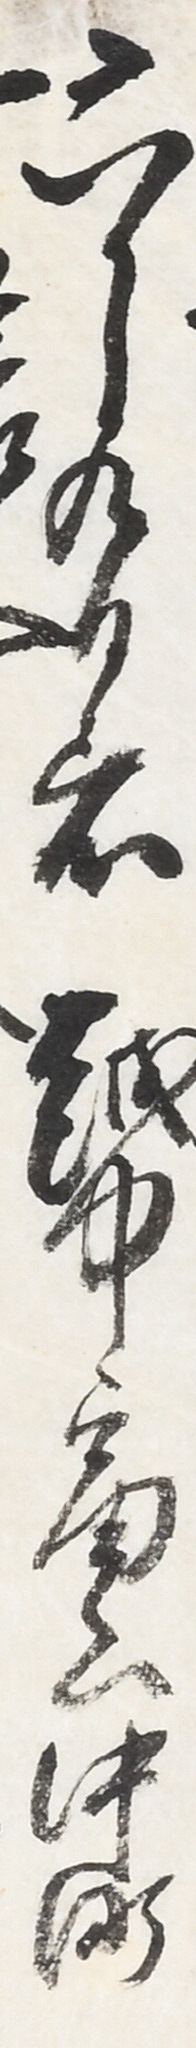六月九日着越中富山中町
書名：旅人泊控帳
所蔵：伊那市立高遠町図書館・合同会社AMANE
